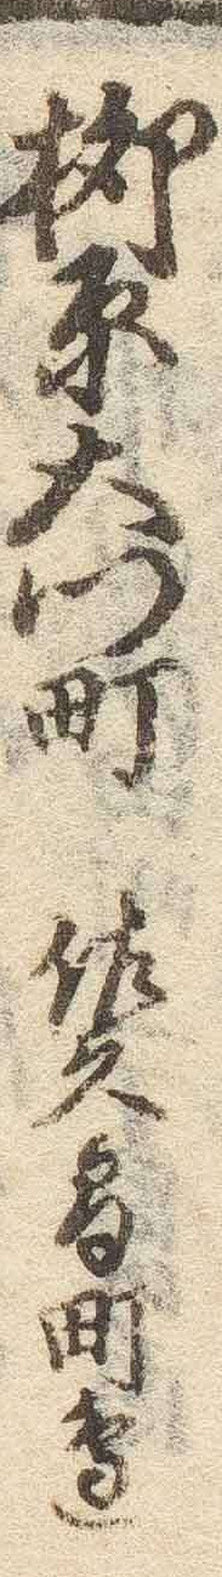柳原大門町佐久間町辺
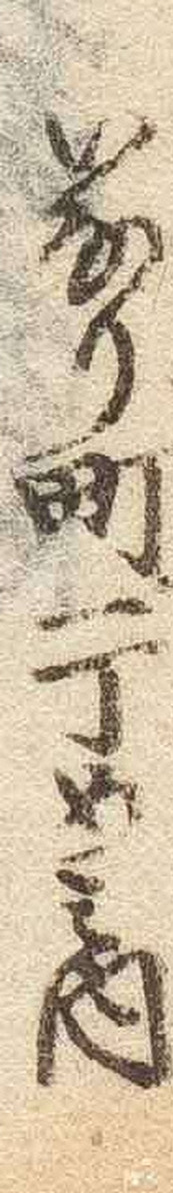いなり町一丁め之内
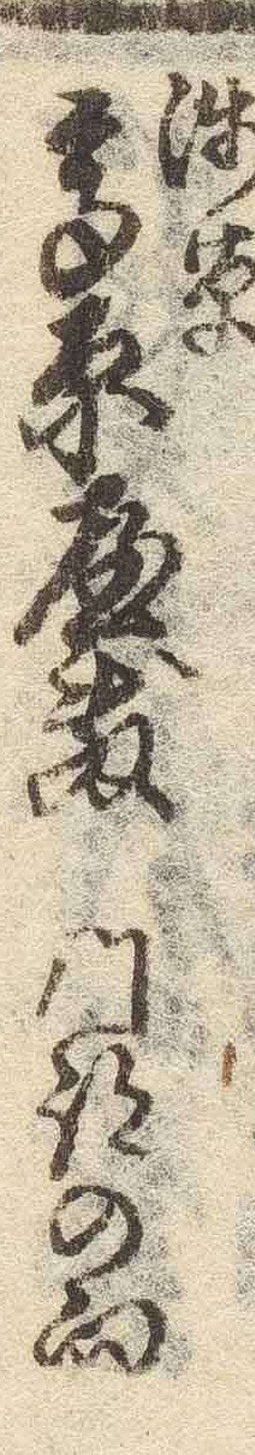高原屋敷門跡の向
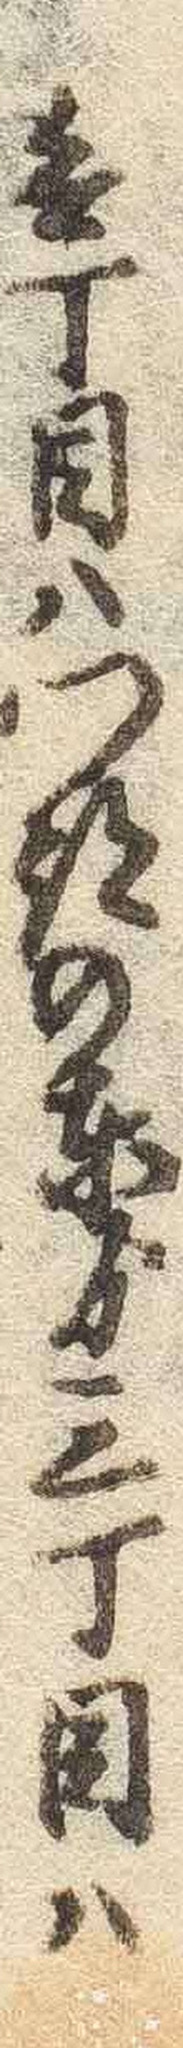壱丁目は門跡の東ゟ三丁目は
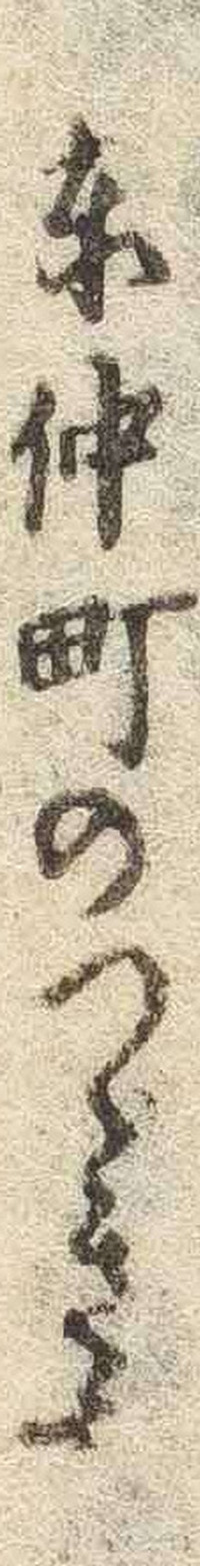東仲町のつゞき也
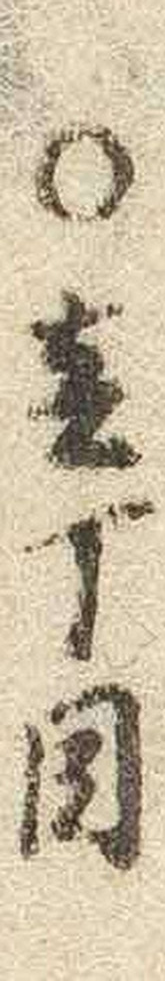◦壱丁目
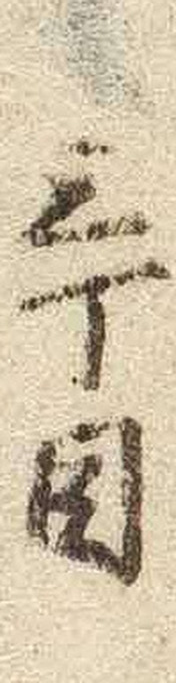三丁目
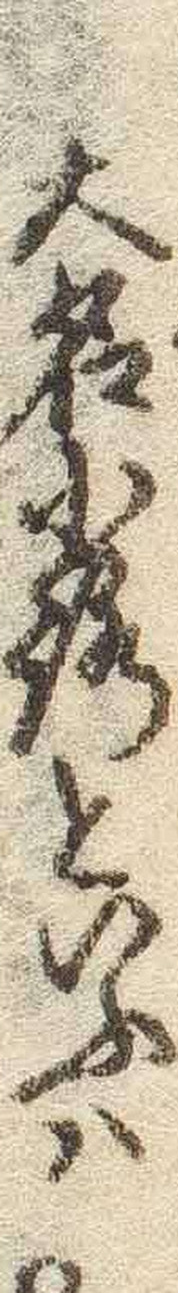大名小路といふは
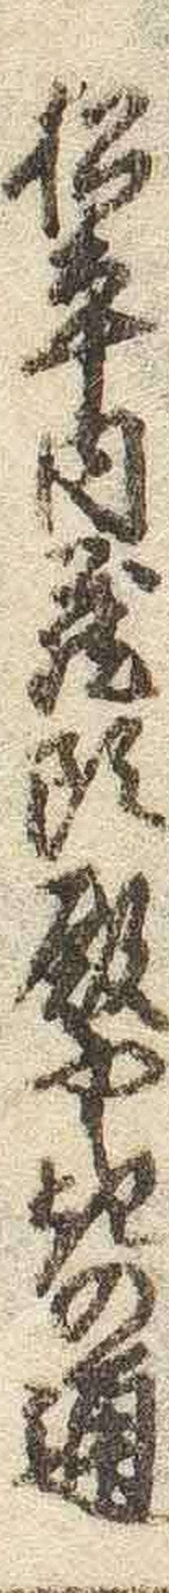松平内蔵頭。殿やしきの通
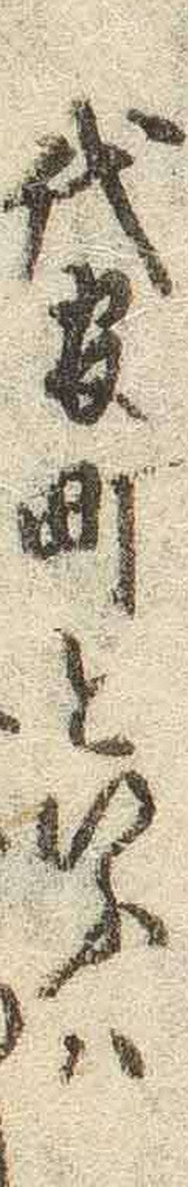代官町といふは
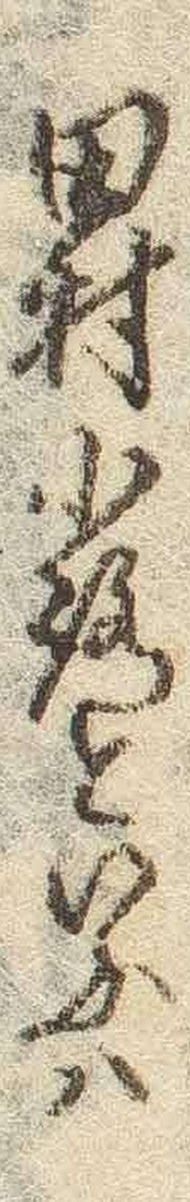田村小路といふは
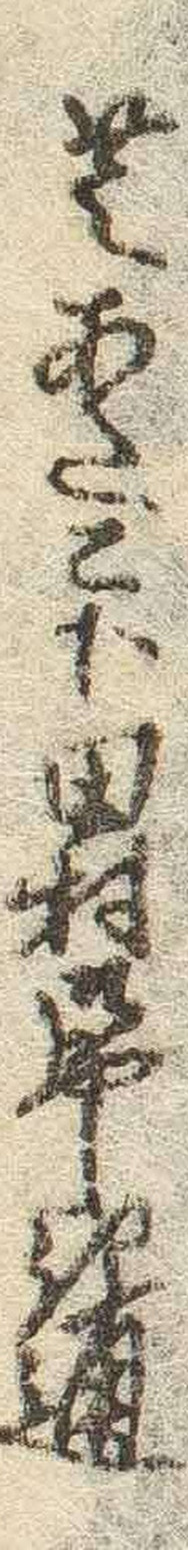芝あたご下田村御やしき通
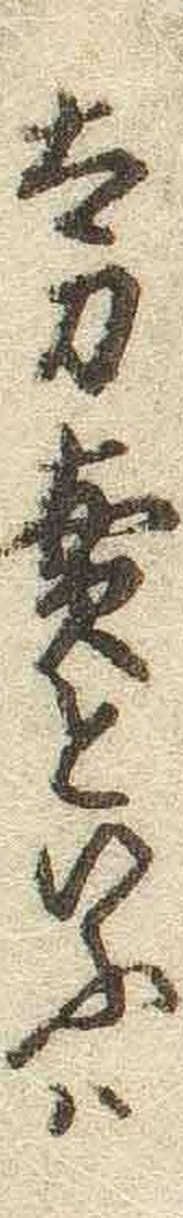太刀売といふは
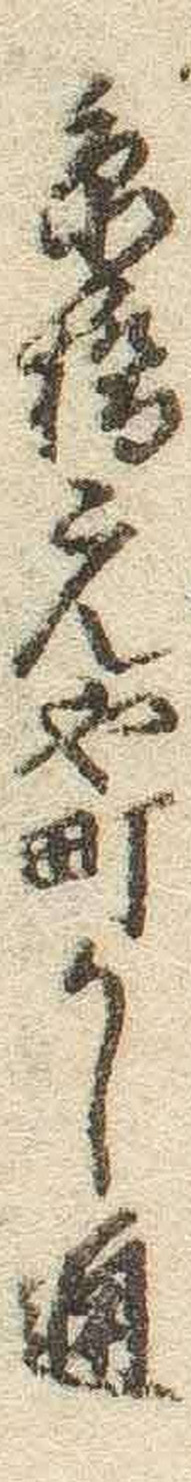京橋こんや町かし通
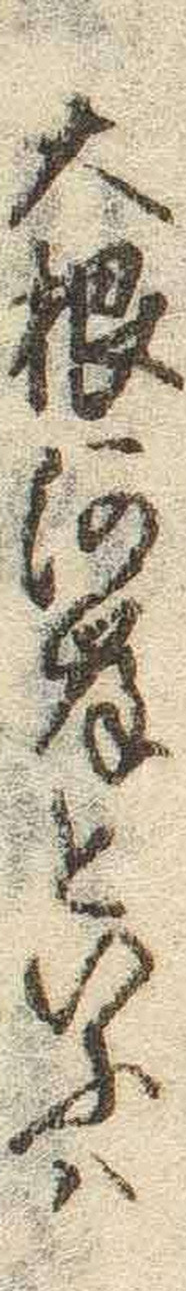大根河岸といふは
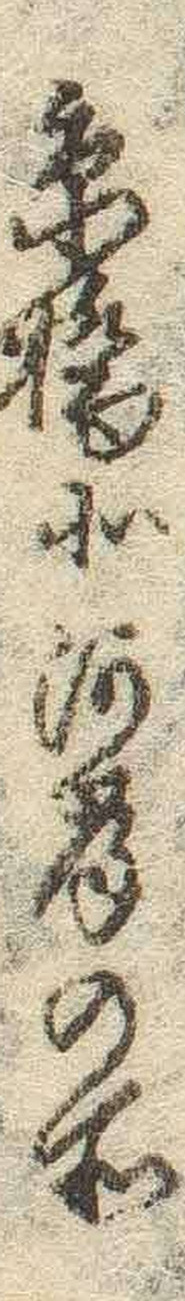京橋北河岸の所
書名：江戸町独案内
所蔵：東京学芸大学附属図書館 国文学研究資料館
